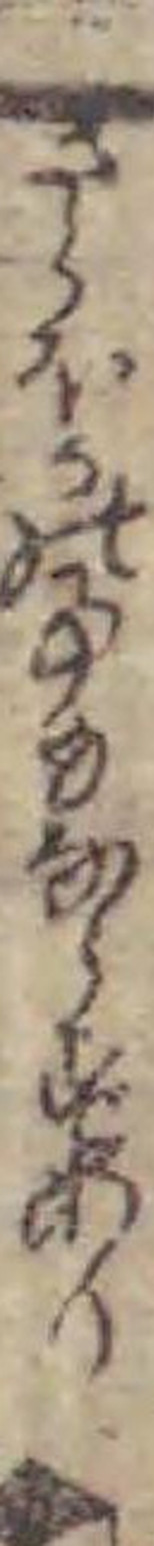さらほかの事もならずあり
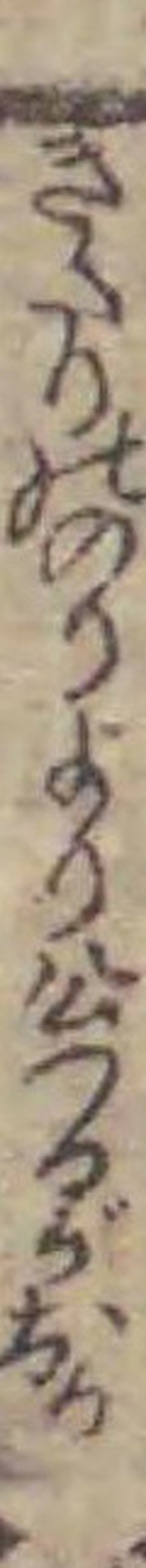きたりののりより公つるがおか
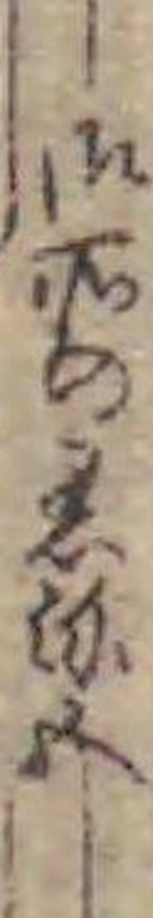御所の黒弥五
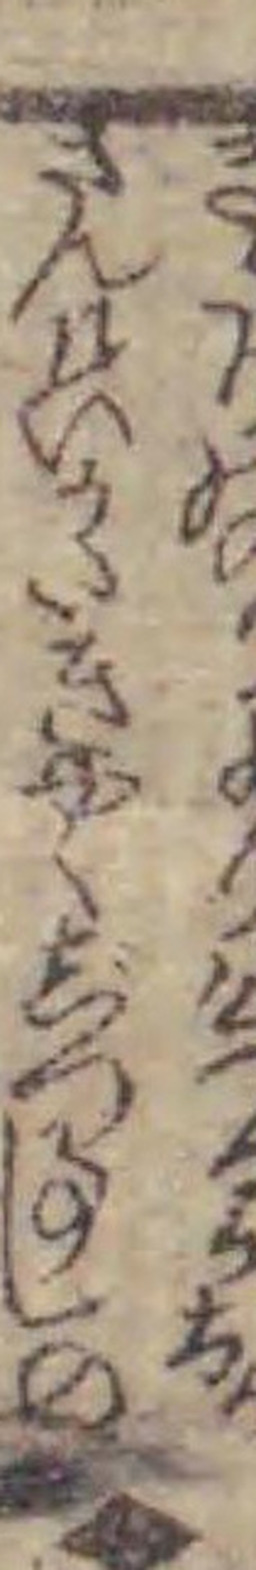さんけいかたきやくじつ事しの
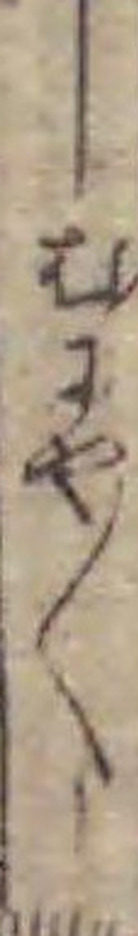むにや〳〵
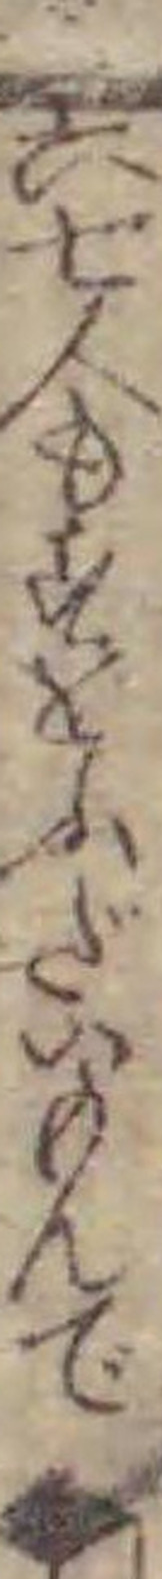六七人もすをふだいもんで
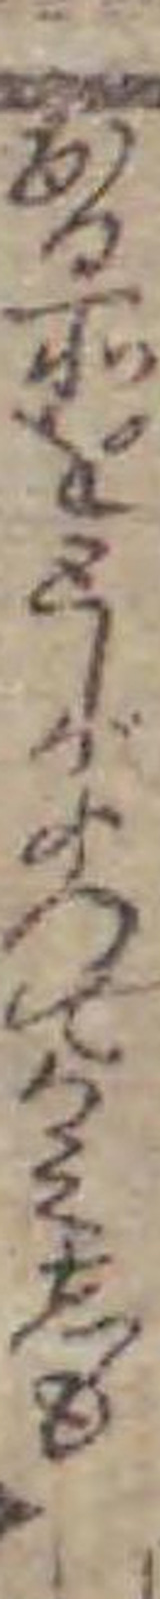おる所をとしがよつてかみしも
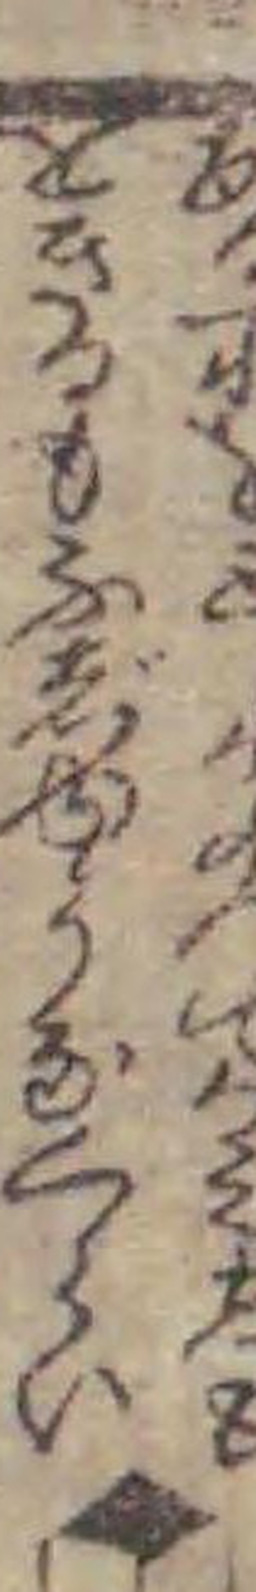をきるもふじゆうなくらい
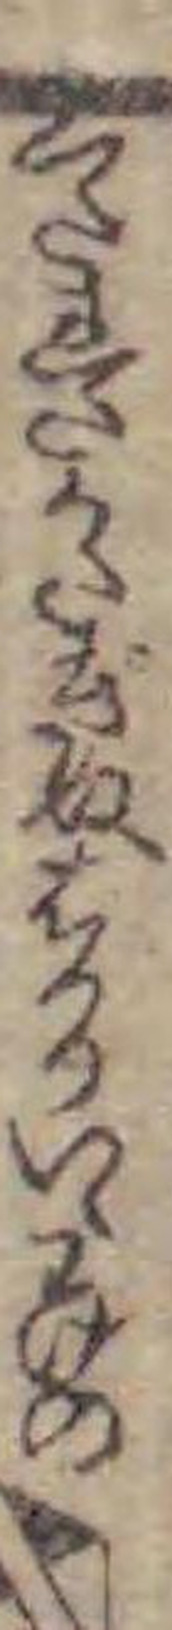くたれたかたぎぬはかりいゝわけの
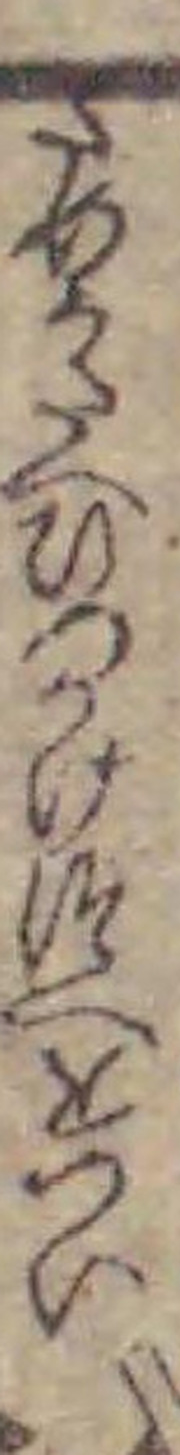ためかたへひつかけつへをつい
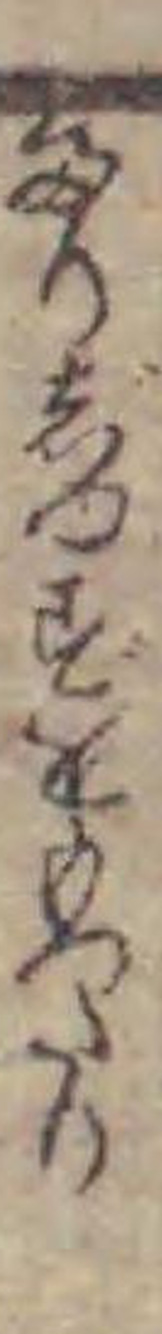たりじゆずをもつたり
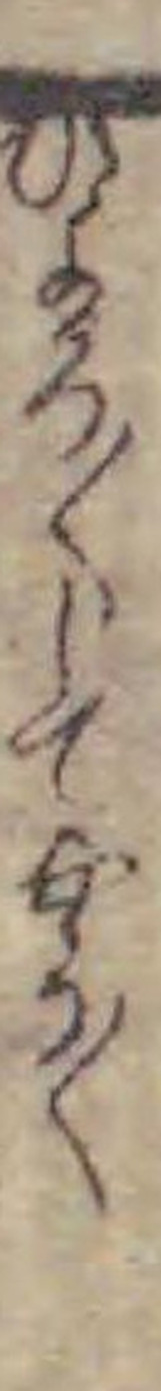ひよろ〳〵してやう〳〵
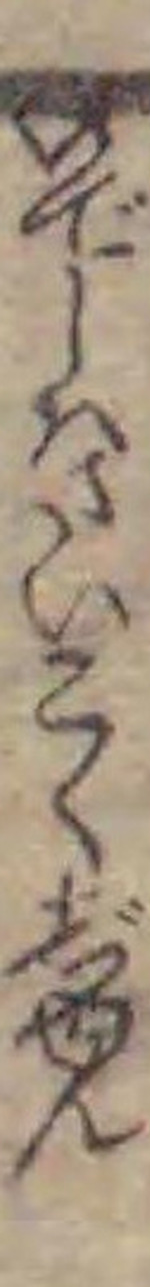いでしはさいこくじゆん
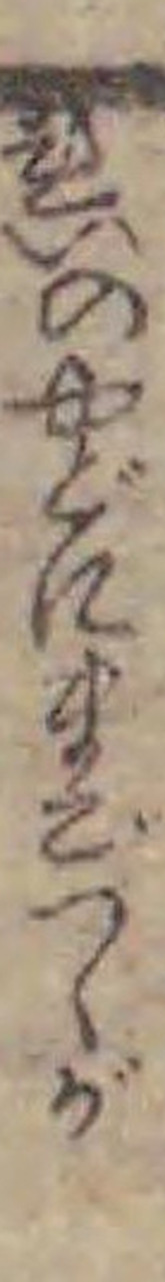れいのやどにまごつくが
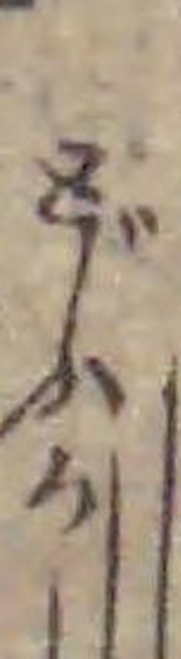どふか
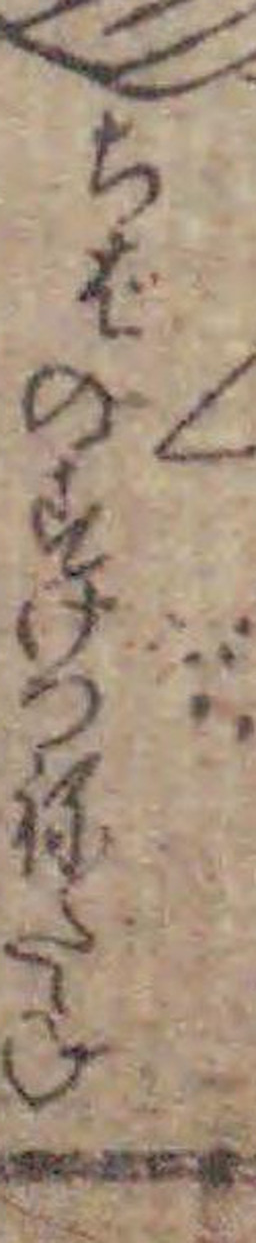ちばのすけつねたね
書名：年寄之冷水曽我 : 3巻
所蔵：国立国会図書館 National Diet Library, JAPAN
